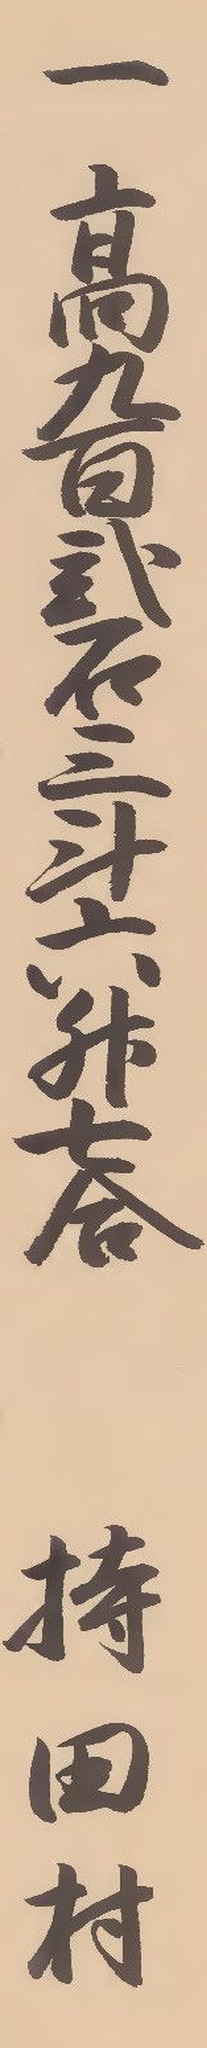一高九百弐石三斗六升七合持田村
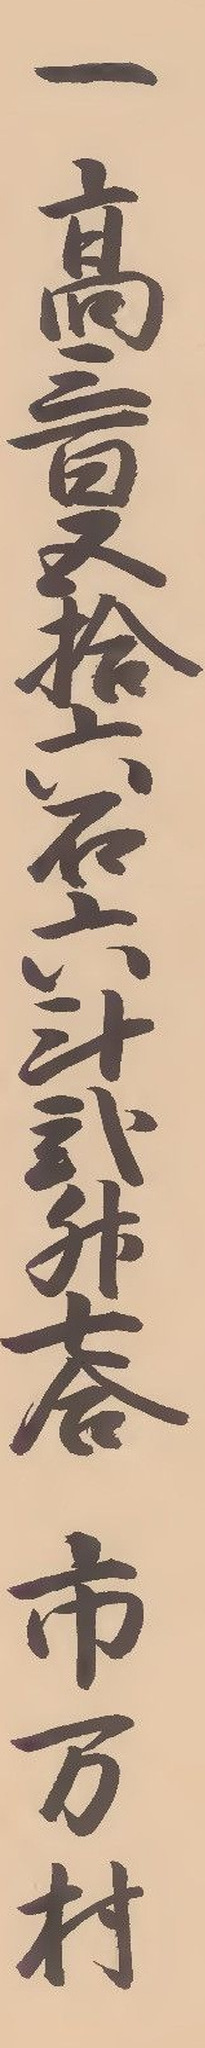一高三百五拾六石六斗弐升七合市万村

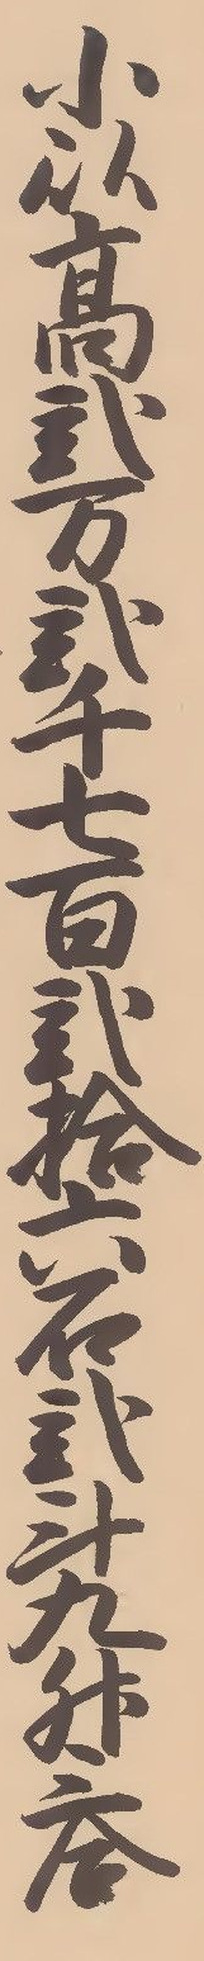小以高弐万弐千七百弐拾六石弐斗九升三合
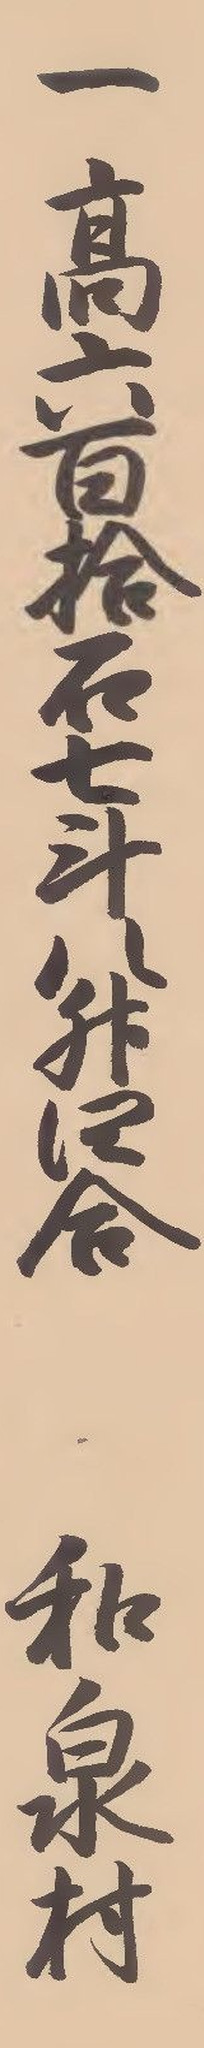一高六百拾石七斗八升四合和泉村
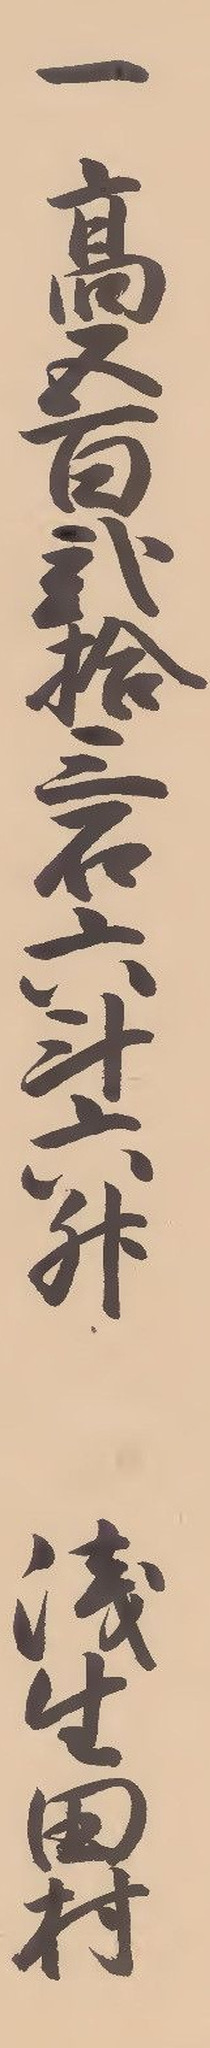一高五百弐拾三石六斗六升浅生田村
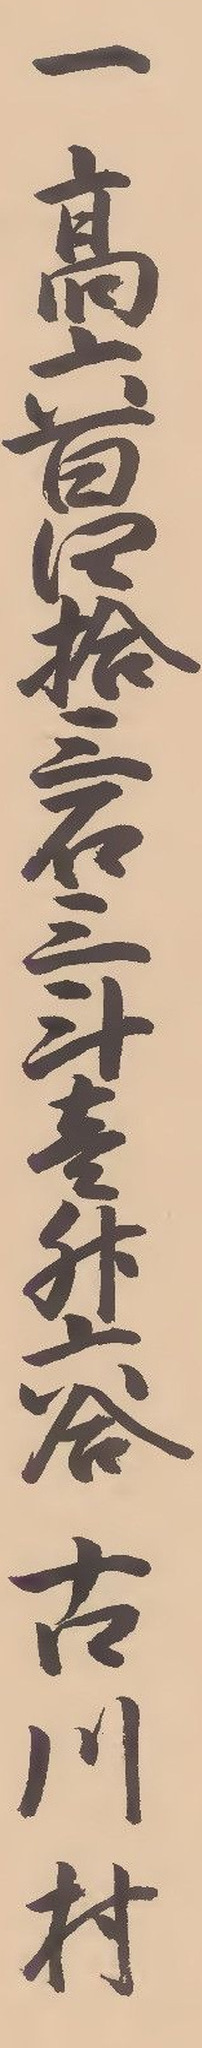一高六百四拾三石三斗壱升六合古川村

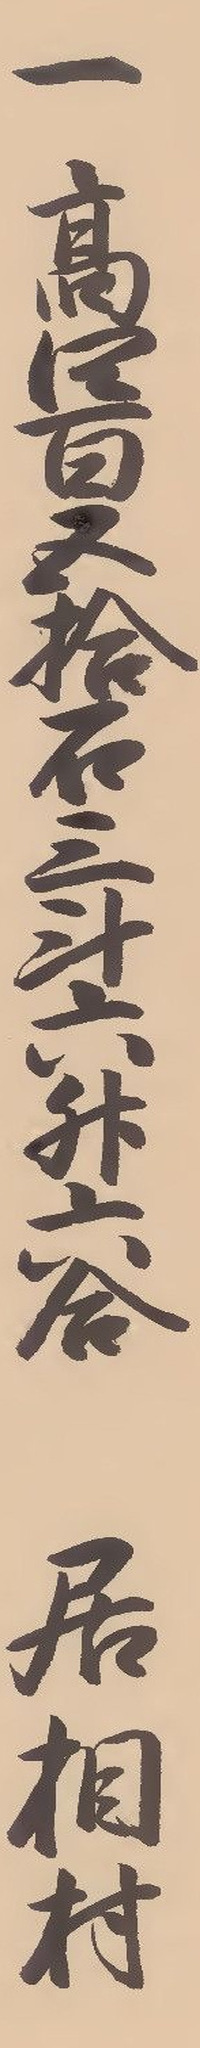一高四百五拾石三斗六升六合居相村
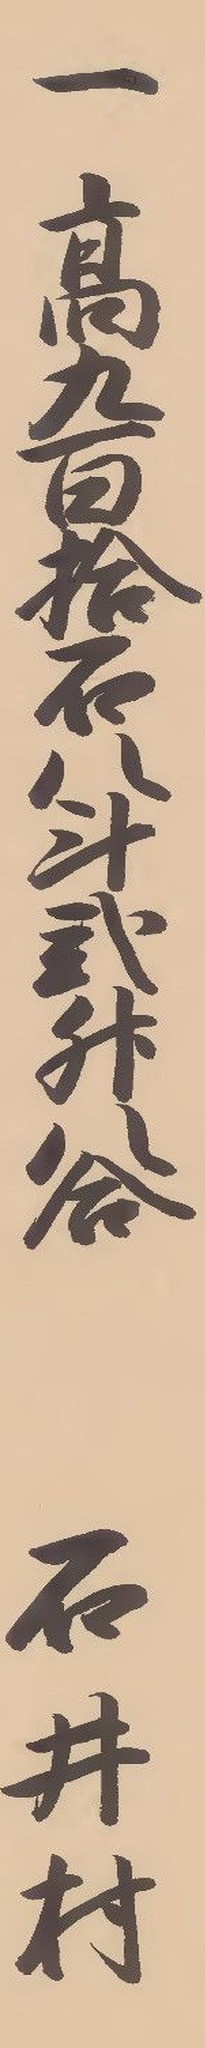一高九百拾石八斗弐升八合石井村
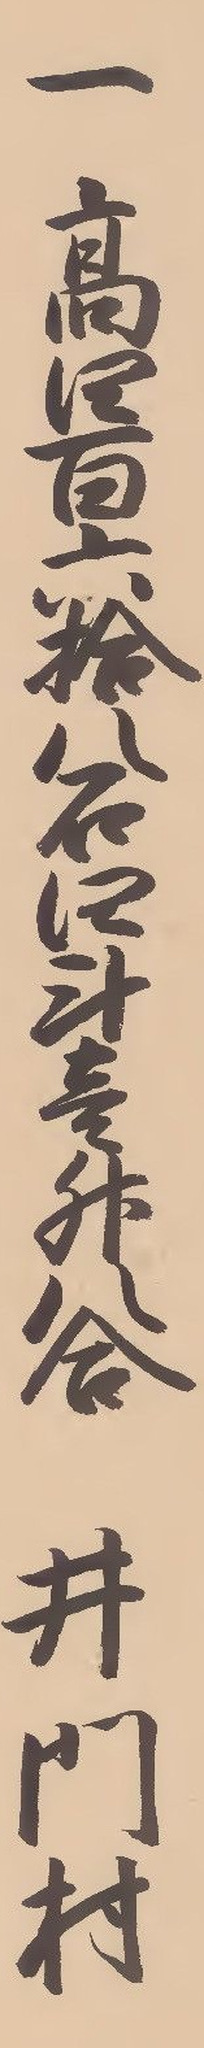一高四百六拾八石四斗壱升八合井門村
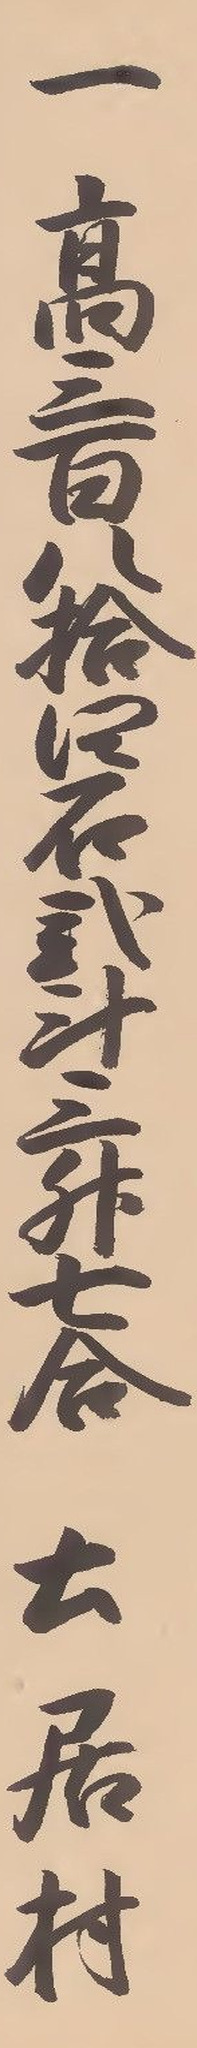一高三百八拾四石弐斗三升七合土居村
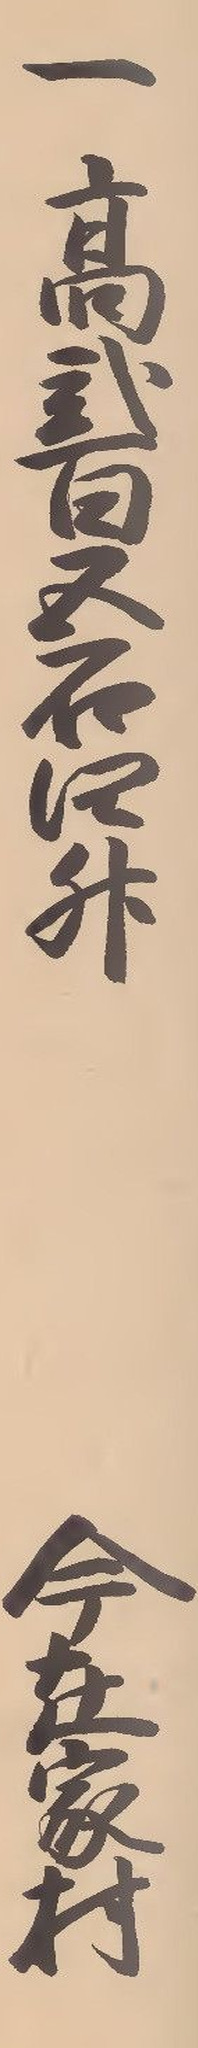一高弐百五石四升今在家村
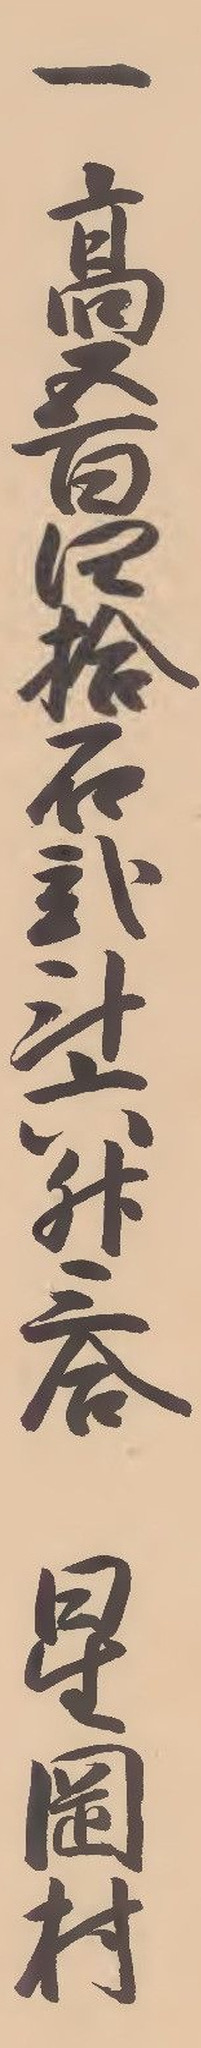一高五百四拾石弐斗六升三合星岡村
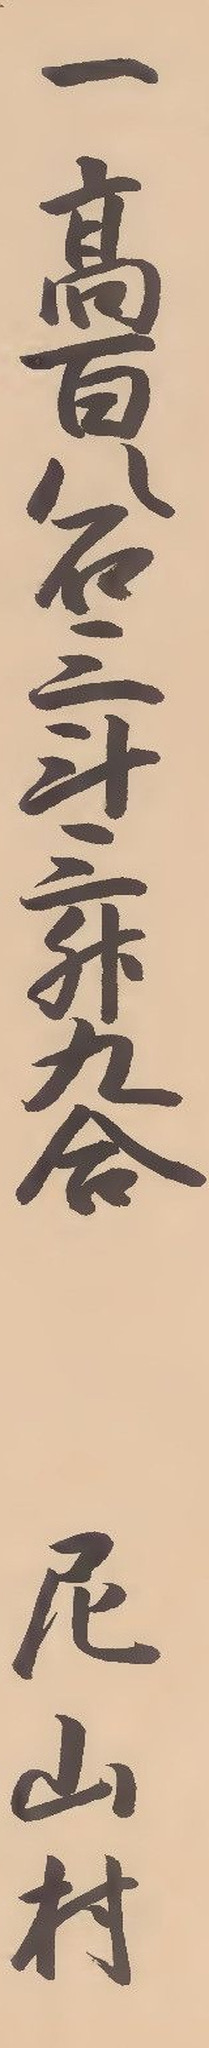一高百八石三斗三升九合尼山村
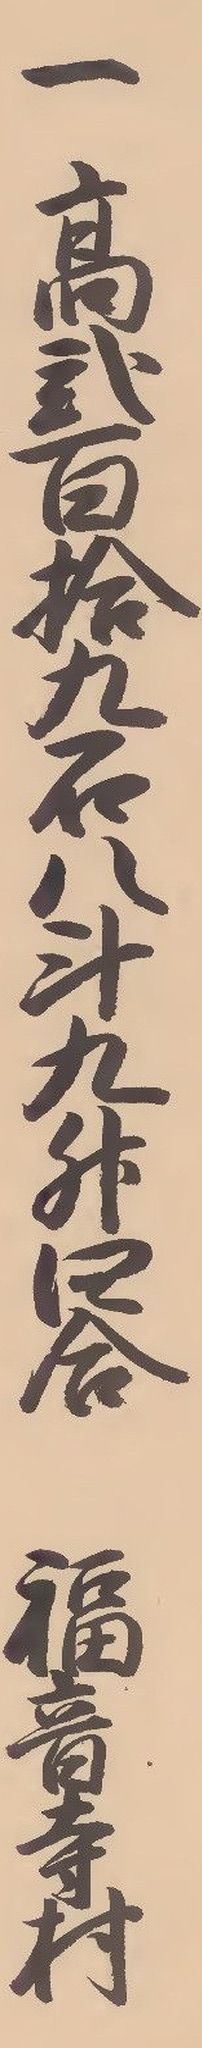一高弐百拾九石八斗九升四合福音寺村

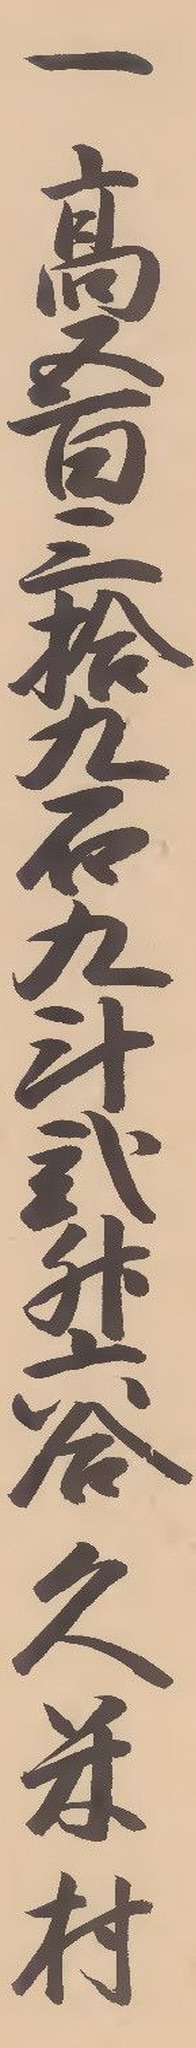一高五百三拾九石九斗弐升六合久米村
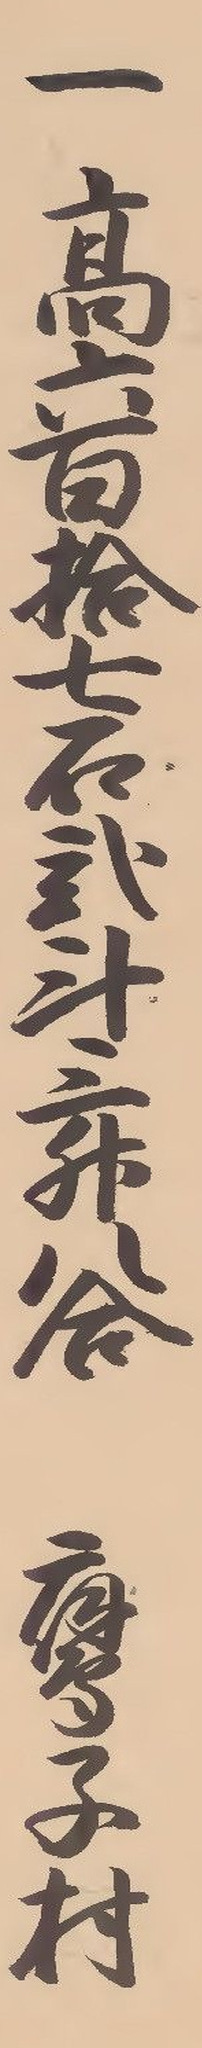一高六百拾七石弐斗三升八合鷹子村
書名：伊予国郷帳
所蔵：国立公文書館 National Archives of Japan
